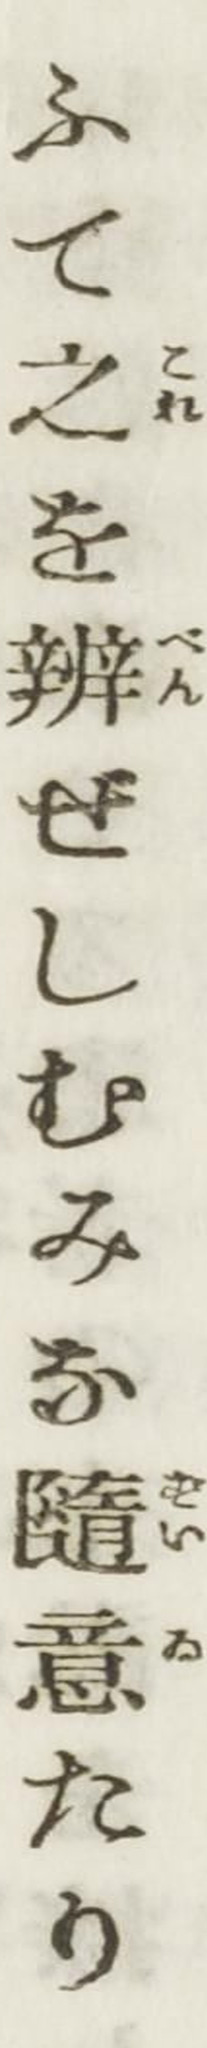ふて之を辨ぜしむみな随意たり
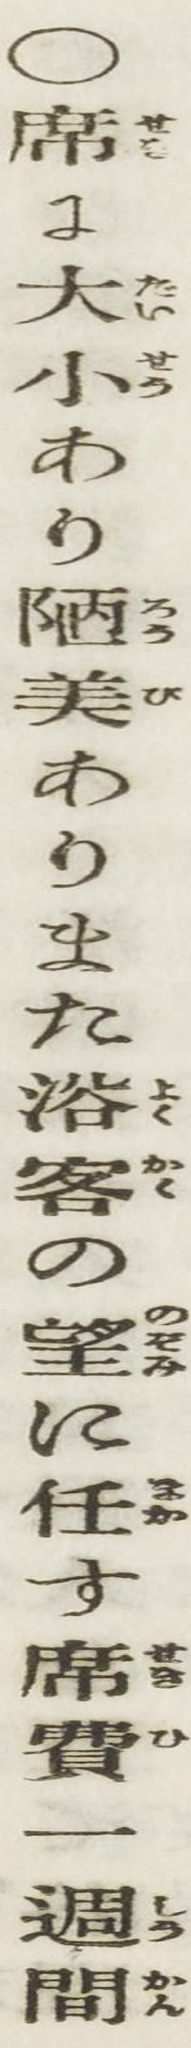○席に大小あり陋美ありまた浴客の望に任す席費一週間
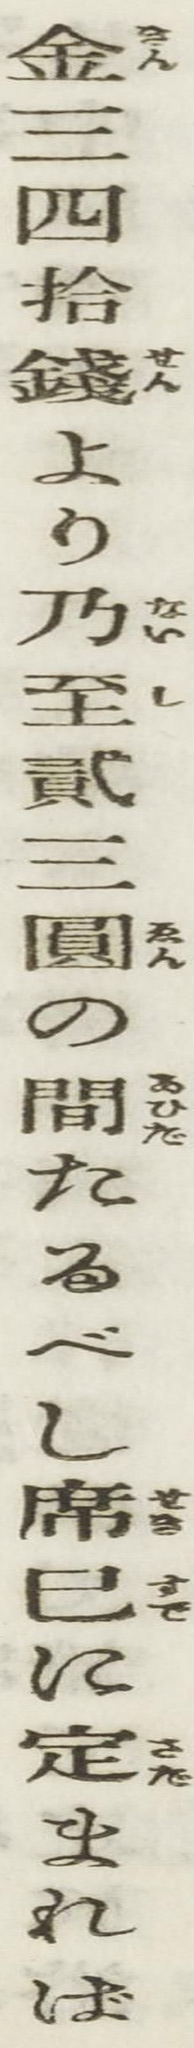金三四拾銭より乃至貮三圓の間たるべし席巳に定まれば
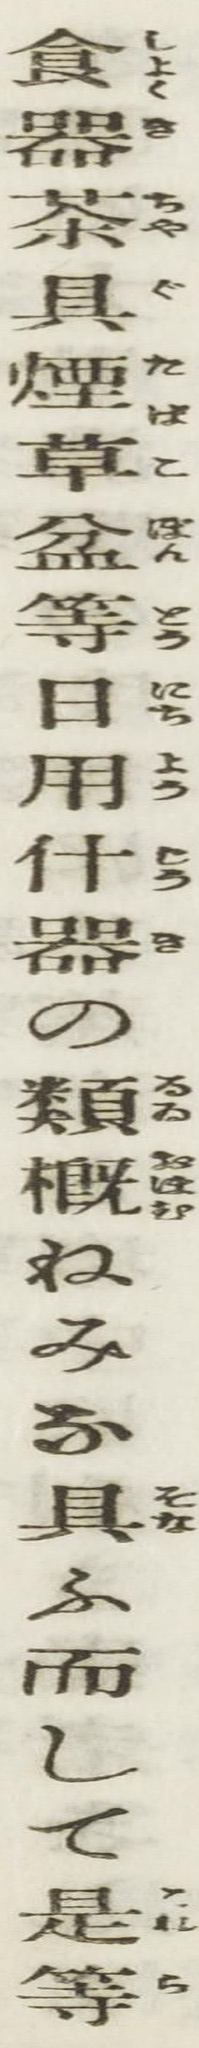食器茶具煙草盆等日用什器の類概ねみな具ふ而して是等
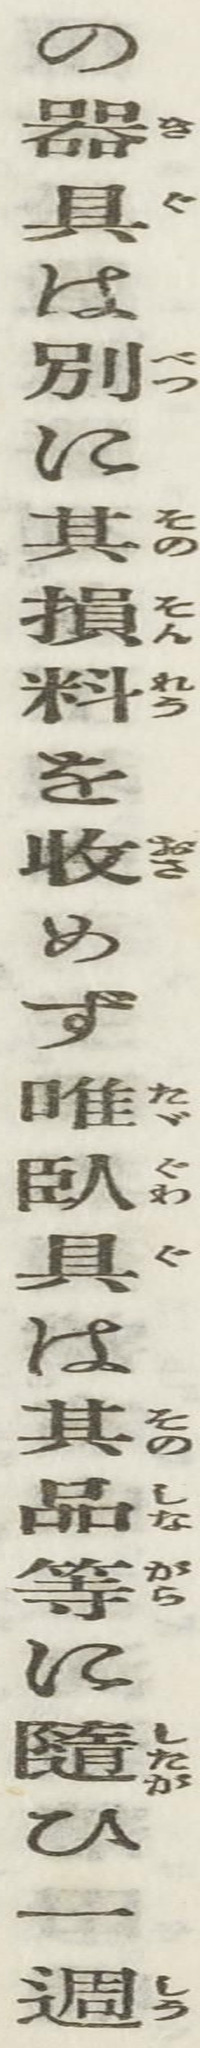の器具は別に其損料を収めず唯臥具は其品等に随ひ一週
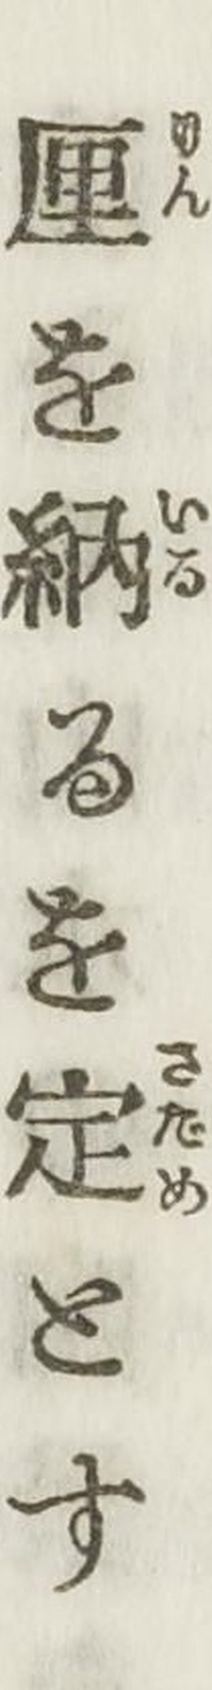厘を納るを定とす
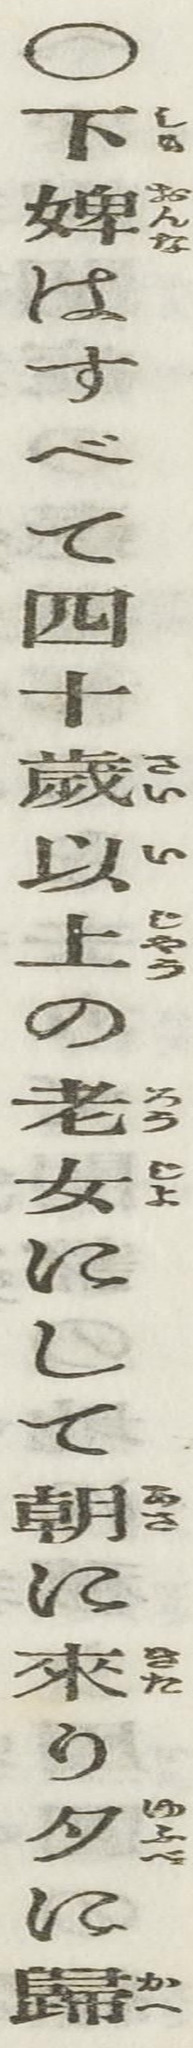○下婢はすべて四十歳以上の老女にして朝に来り夕に帰
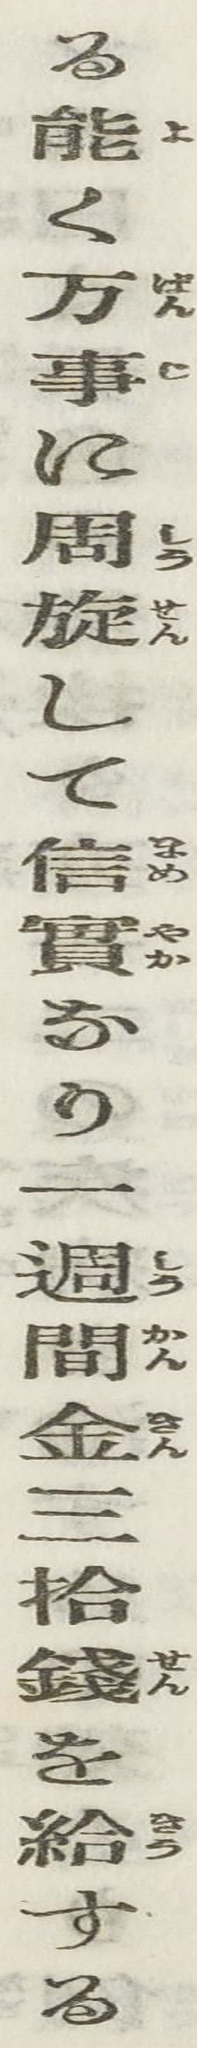る能く万事に周旋して信実なり一週間金三拾銭を給する
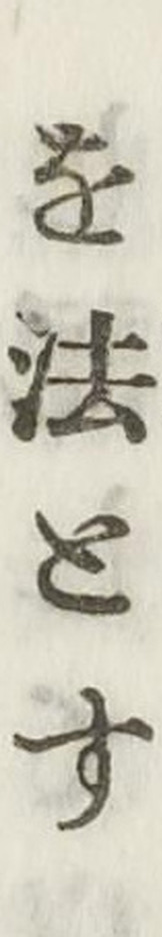を法とす
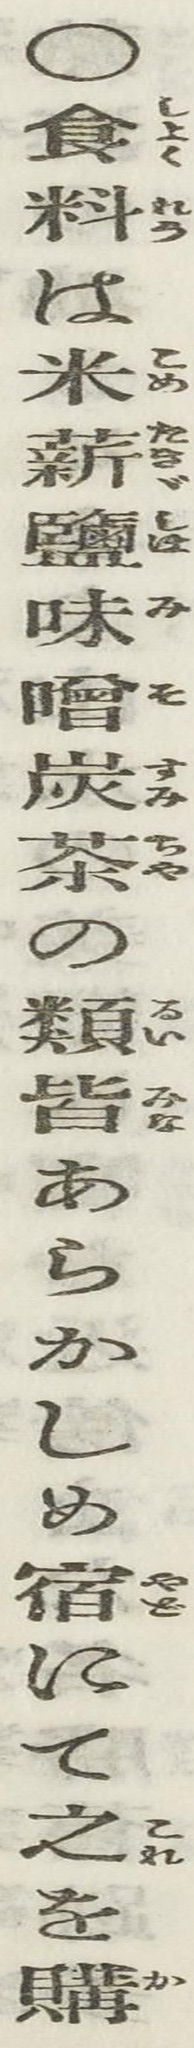○食料は米薪鹽味噌炭茶の類皆あらかしめ宿にて之を購
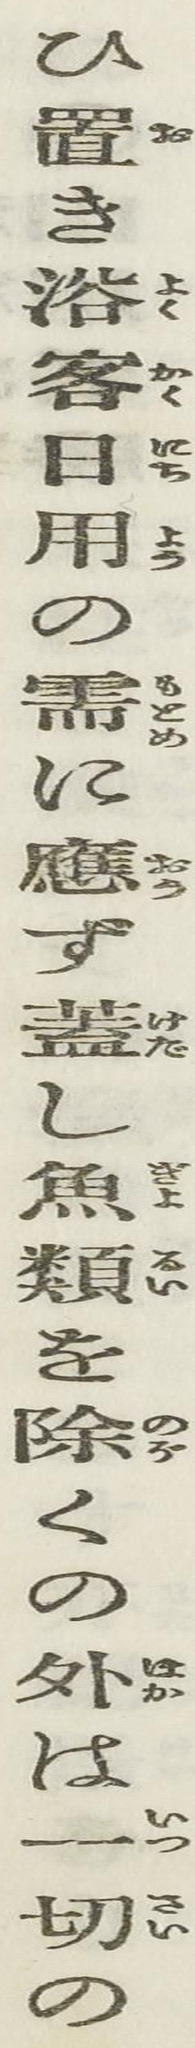ひ置き浴客日用の需に応ず蓋し魚類を除くの外は一切の
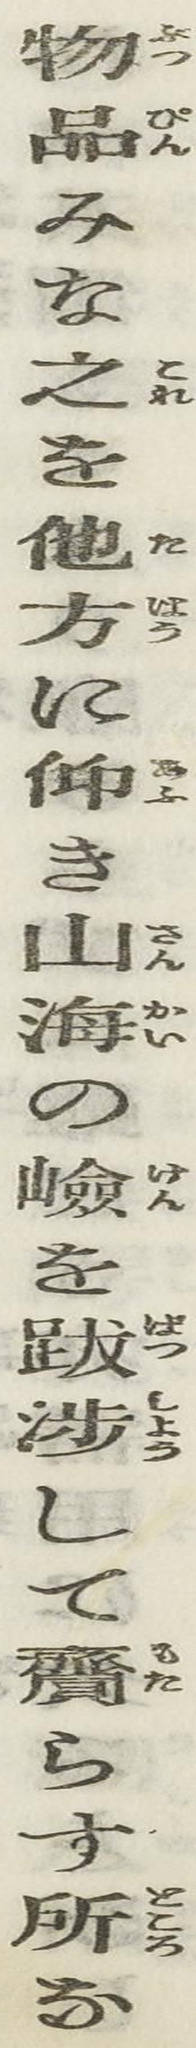物品みな之を他方に仰き山海の嶮を跋渉して齎らす所な

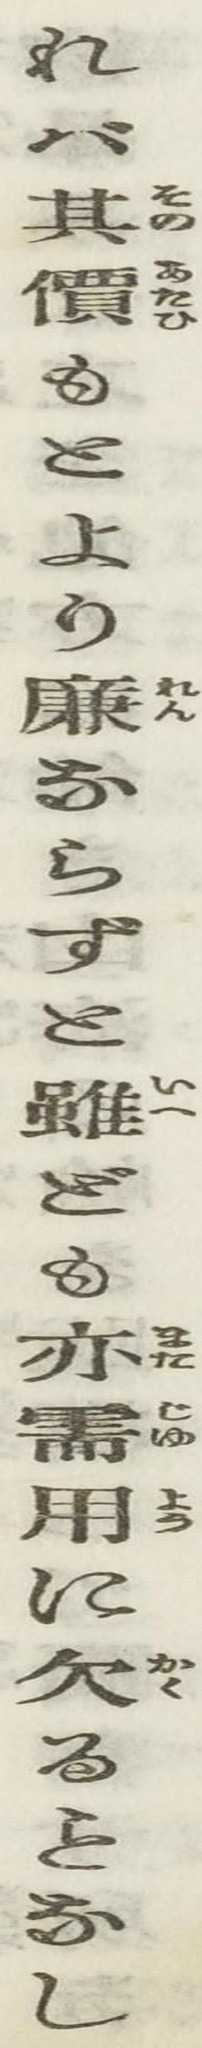れば其價もとより廉ならずと雖ども亦需用に欠ることなし
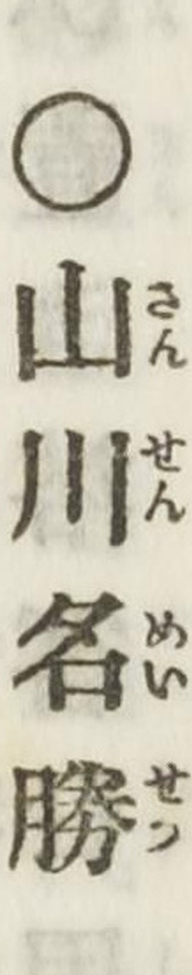○山川名勝
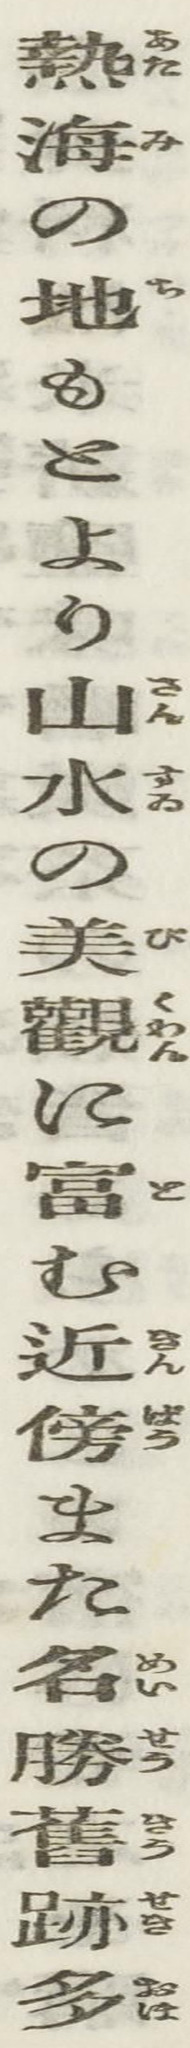熱海の地もとより山水の美観に富む近傍また名勝旧跡多
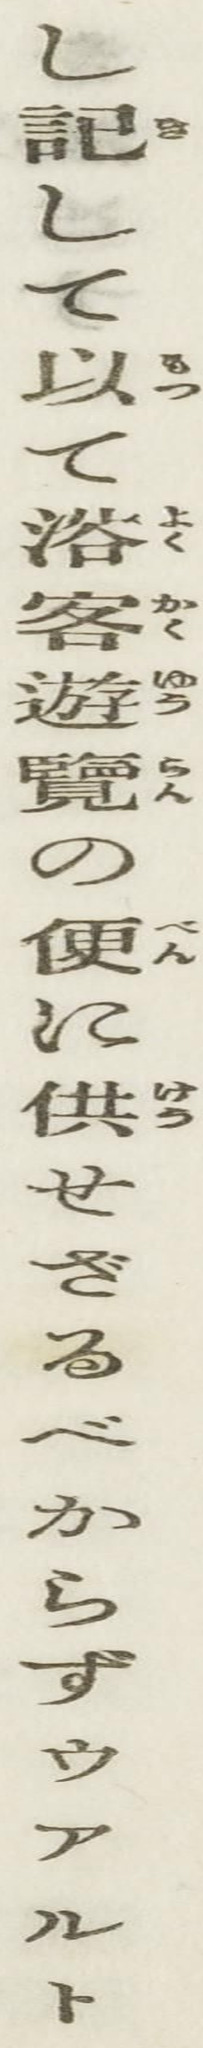し記して以て浴客遊覧の便に供せざるべからずウアルト
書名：熱海獨案内　全
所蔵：東京大学地震研究所図書室 Earthquake Research Institute Library, The University of Tokyo, JAPAN
